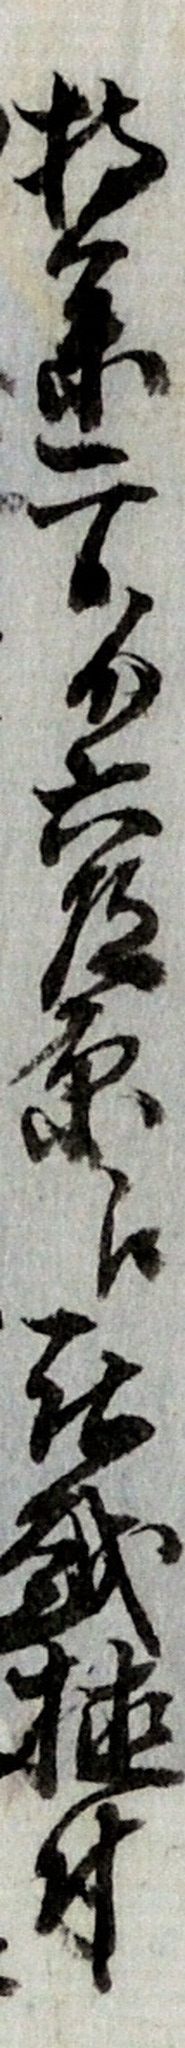持参二日ゟ六道原江罷越植付
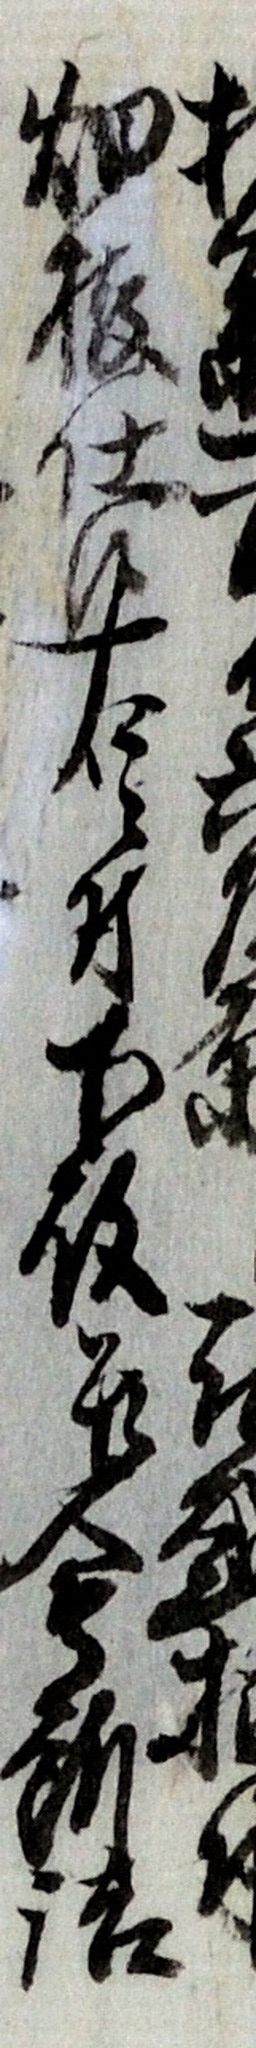畑拵仕候右ニ付下役幷会所詰
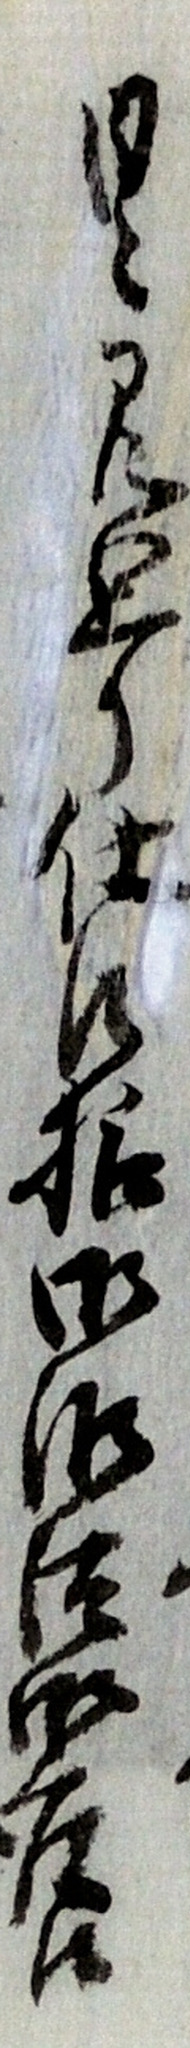日々見廻り仕候様御佐汰御座候
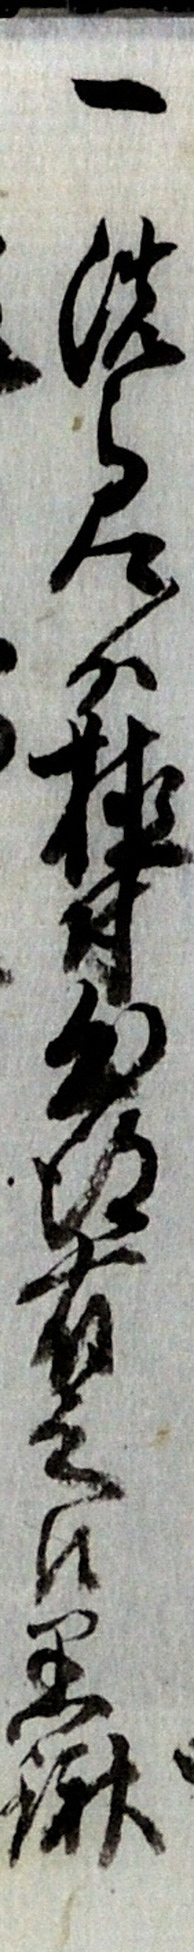一洗馬郷ゟ植付出役有之候黒鍬
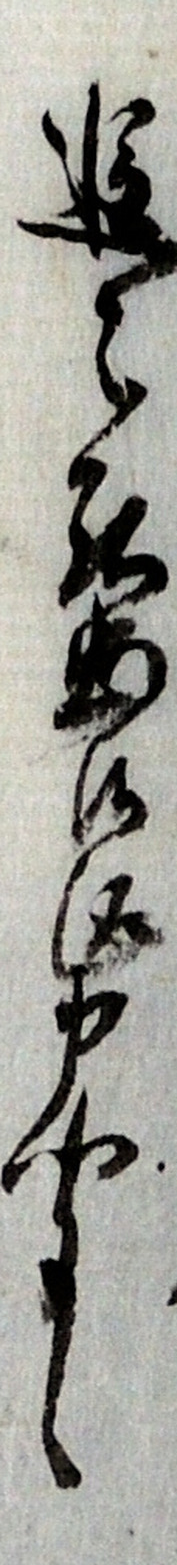追々罷出候趣申聞候
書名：諸事御用留
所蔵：伊那市立高遠町図書館・合同会社AMANE
